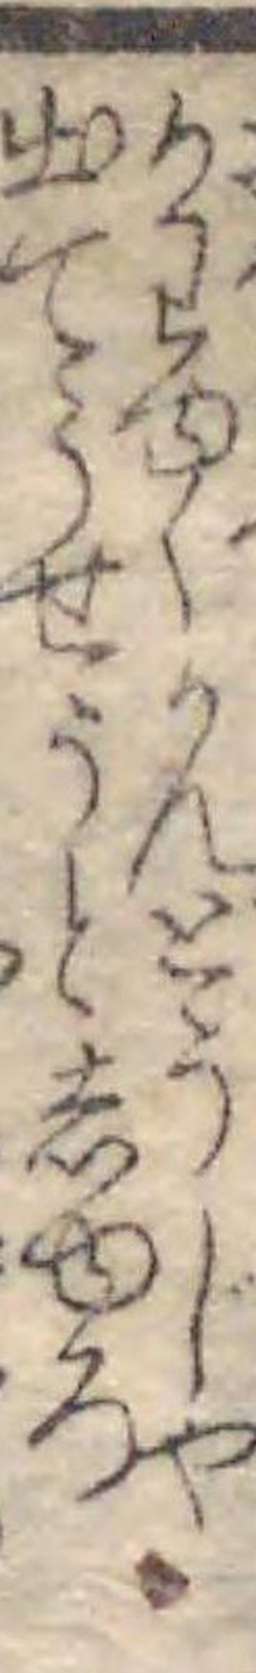出てうせうとしゆろ
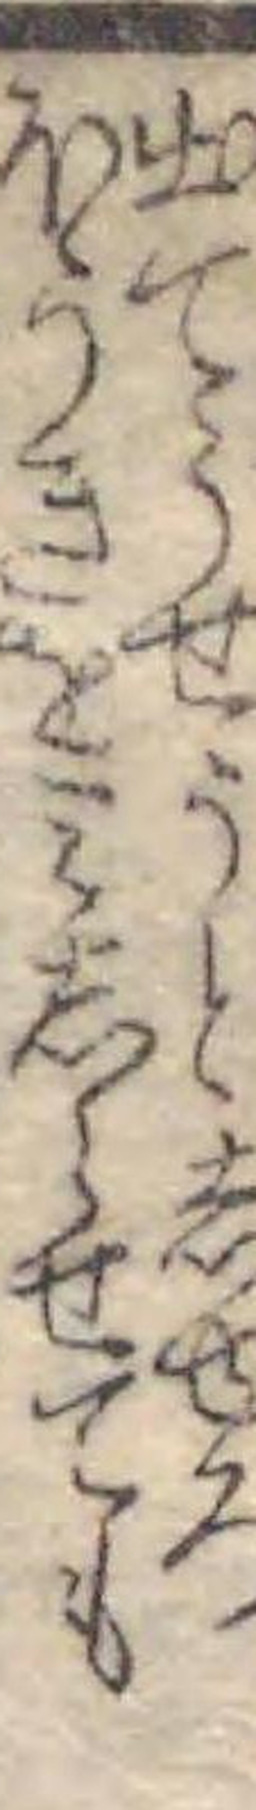ほうきをみしらせても
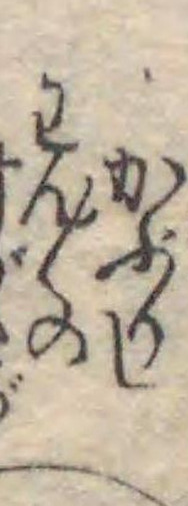かぶりし
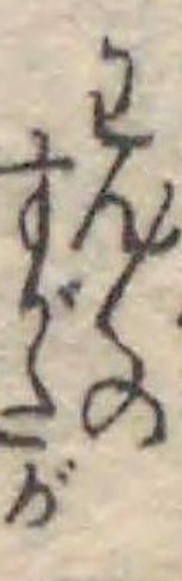わん〳〵の
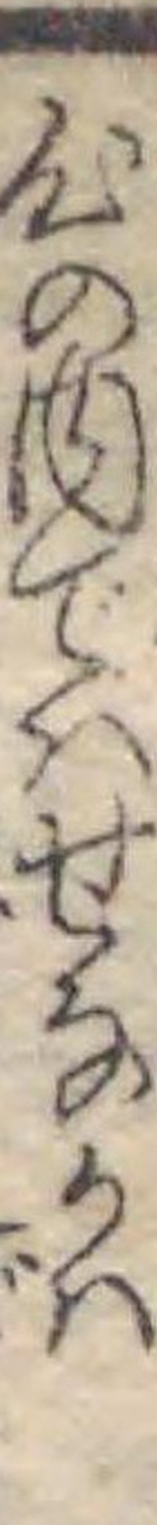心の内ではせなかは
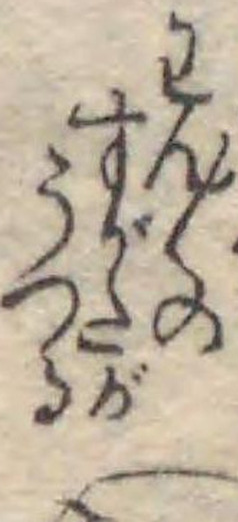すがたが
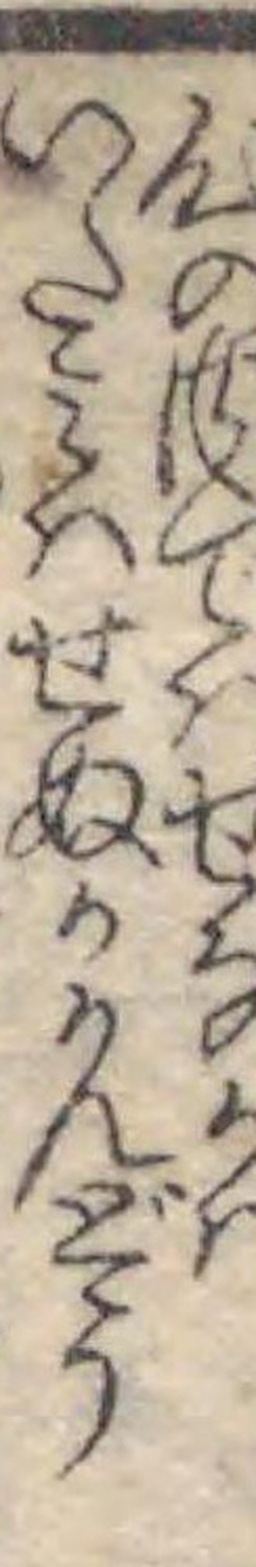いたみはせぬかかんどう
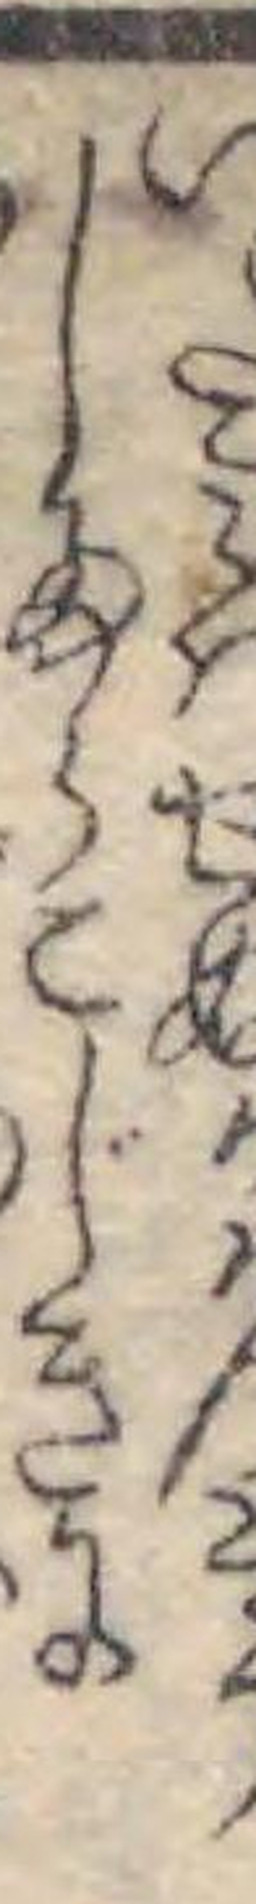したらこじきに
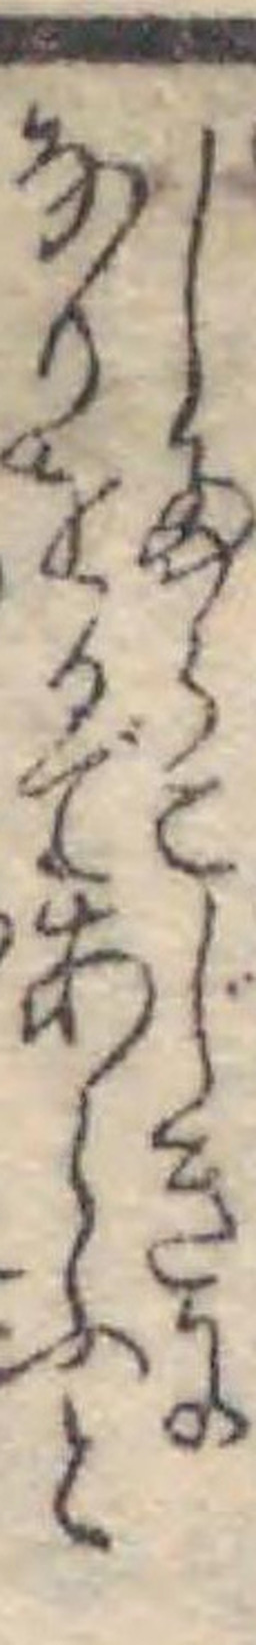なりをるであらふと
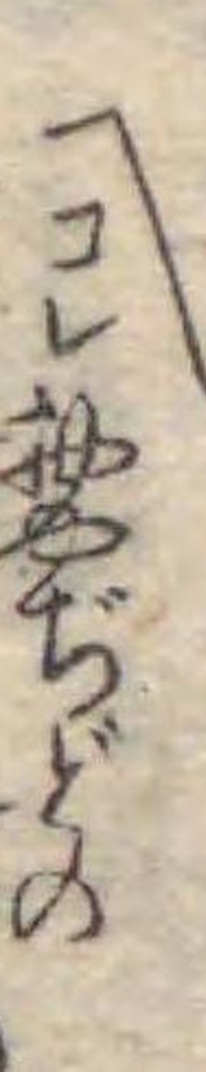〽コレおやぢどの
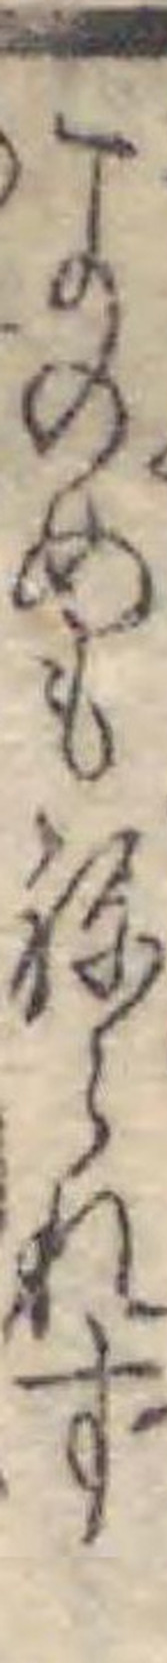よのめもねられす
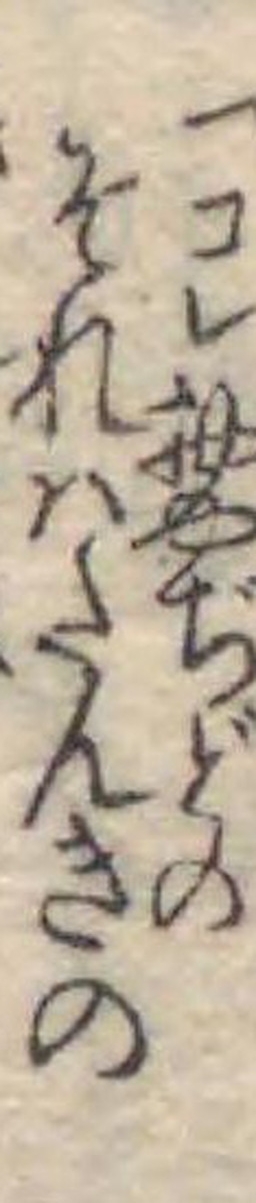それはたんきの
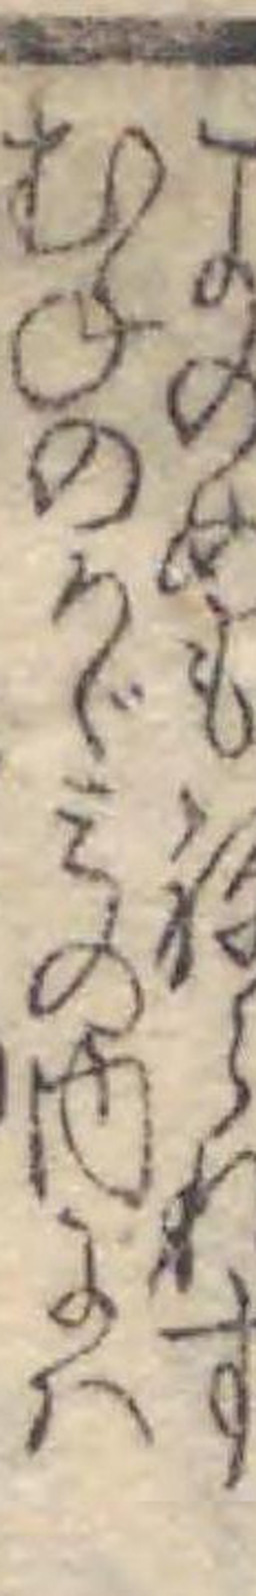むねのかゞみの内には
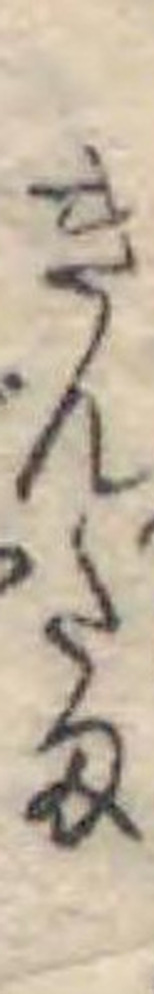きんたま
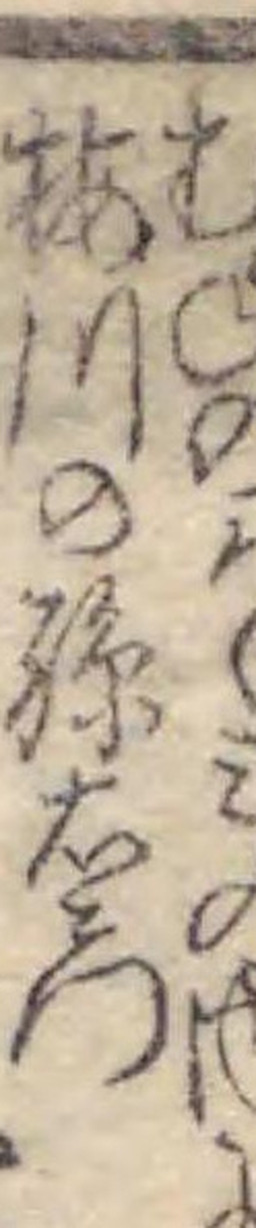梅川の孫右衛門
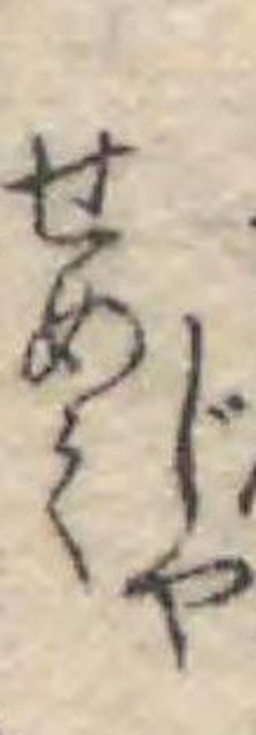せめて
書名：人心鏡写絵 : 3巻
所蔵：国立国会図書館 National Diet Library, JAPAN
